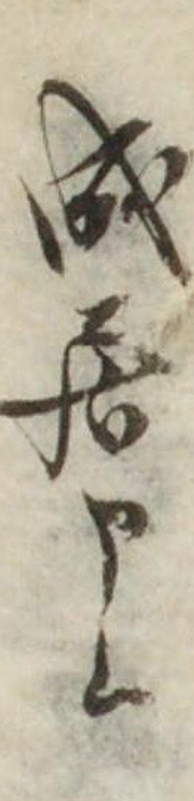成居申候
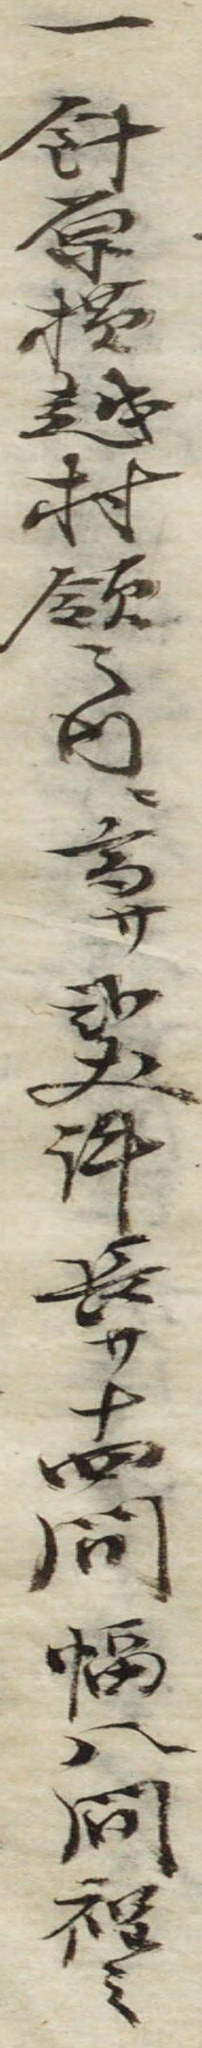一針原横越村領之内に高さ弐丈許長十四間幅八間程之
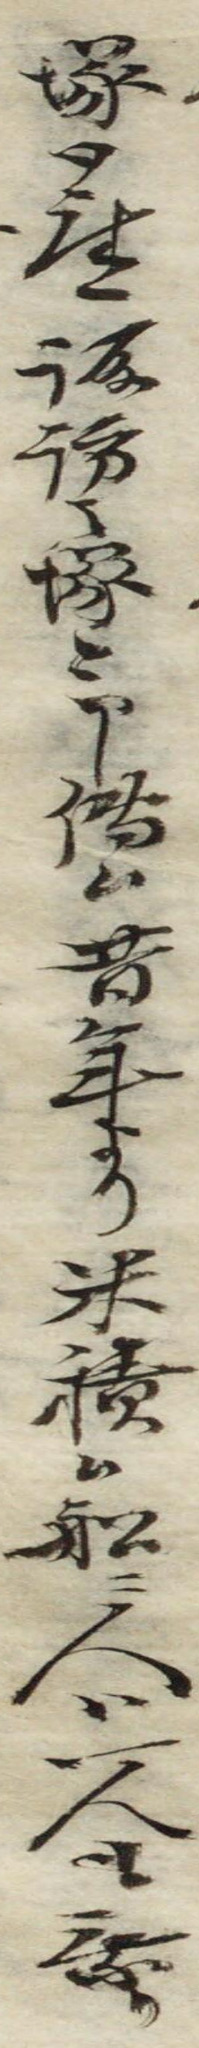塚御座候諏訪之塚と申伝候昔年より米積候船に人は一人も乗り
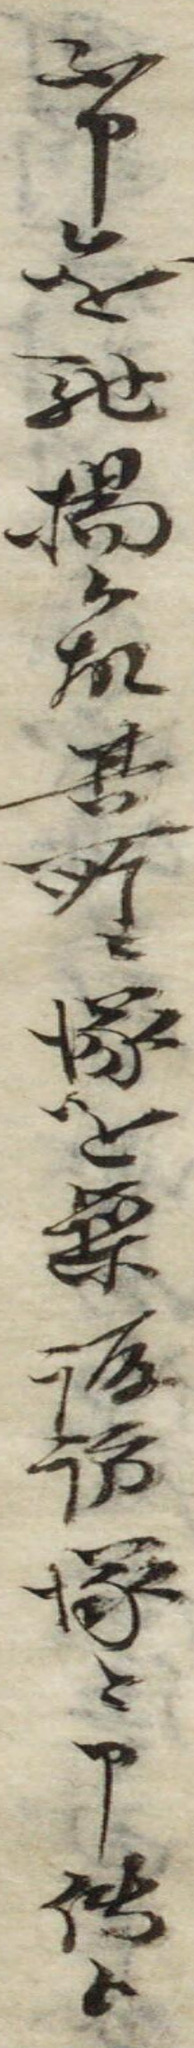不申候を馳場ヶ故其所に塚を築諏訪塚と申伝候

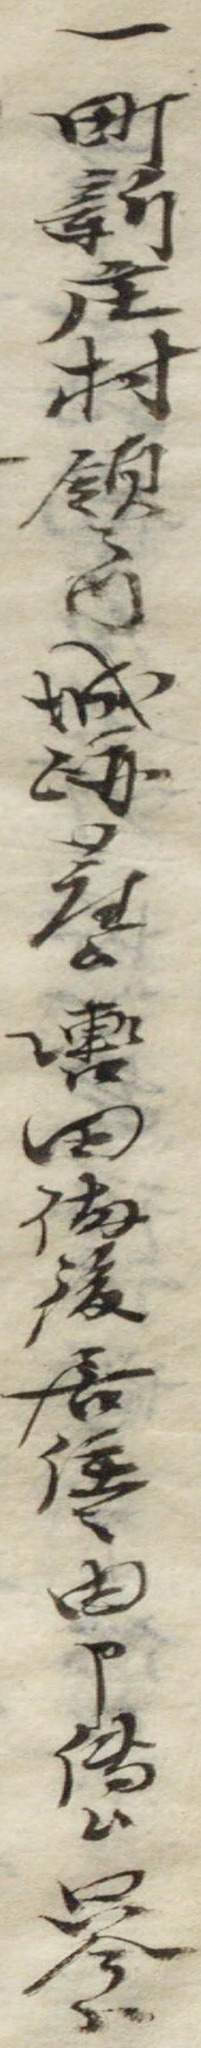一町新庄村領内領之内城跡御座候轡田備後居住之由申伝候只今は
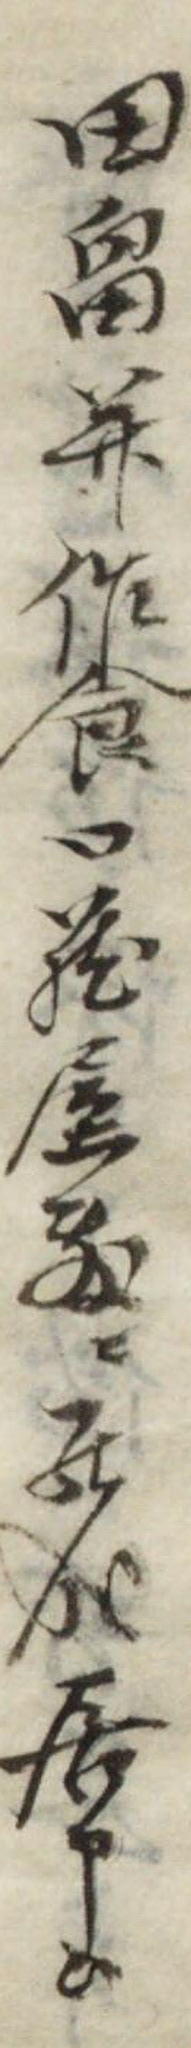田畠并作食御蔵屋敷に罷成居申候
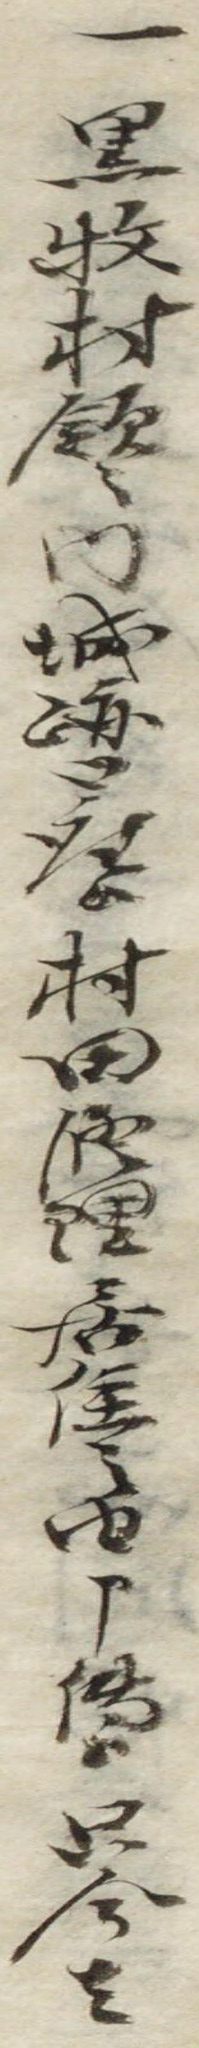一黒牧村領之内城跡御座候村田修理居住之由申伝候只今は
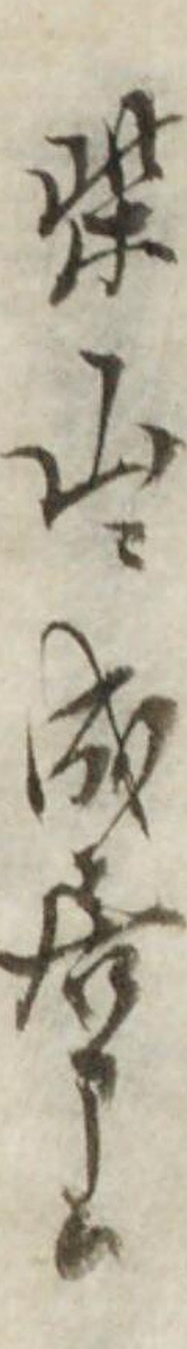柴山に成居申候
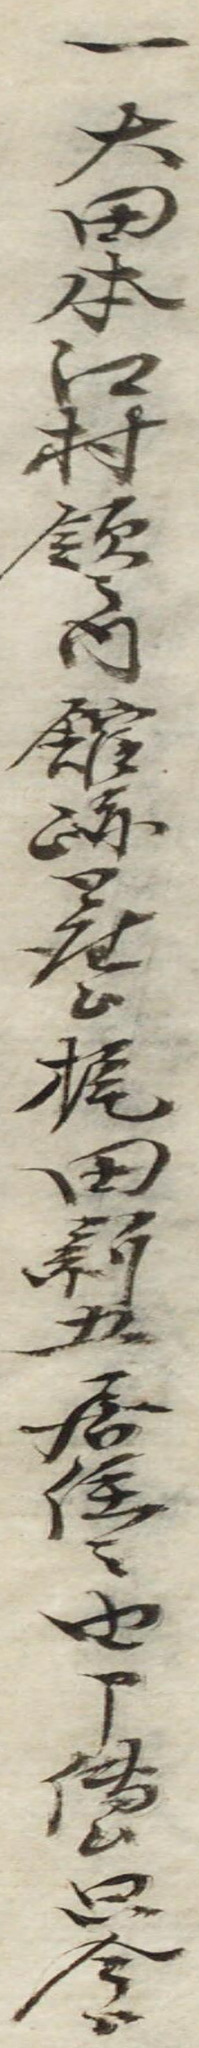一太田本江村領之内館跡御座候梶田新五居住之由申伝候只今は
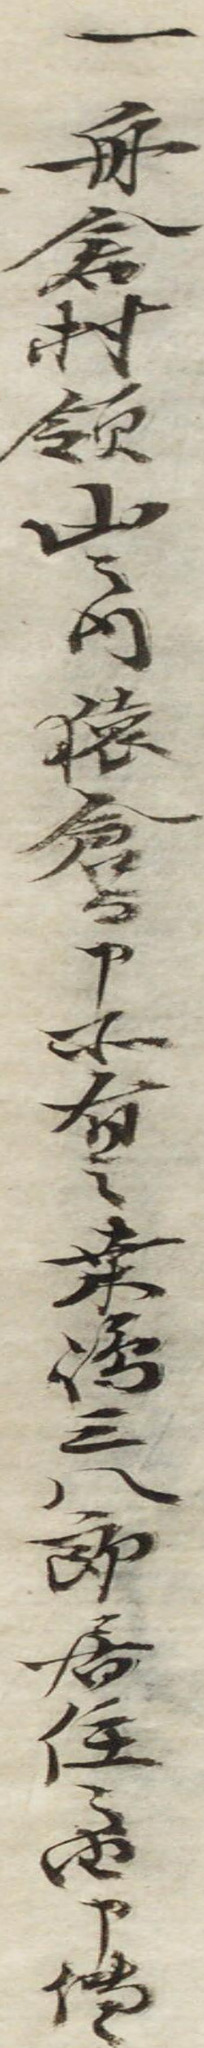一舟倉村領山之内猿倉与申所有之桑嶋三八郎居住之由申伝候
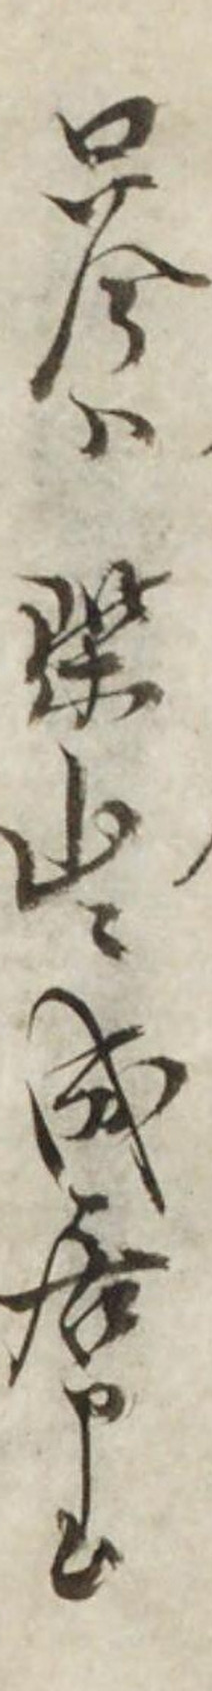只今は柴山に成居申候
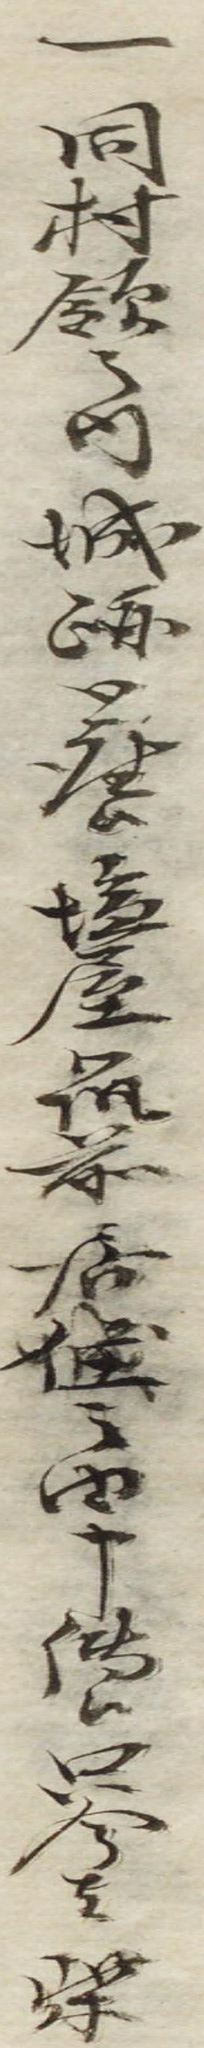一同村領之城跡御座候塩谷筑前居住之由申伝候只今は柴
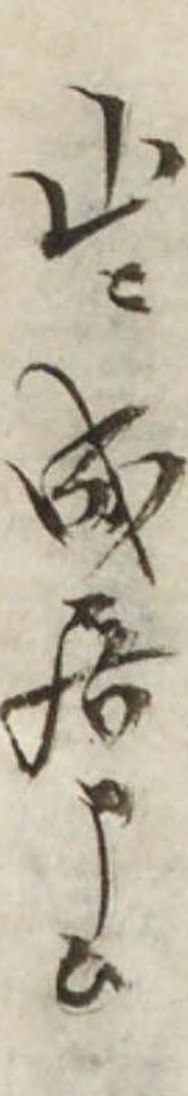山に成居申候
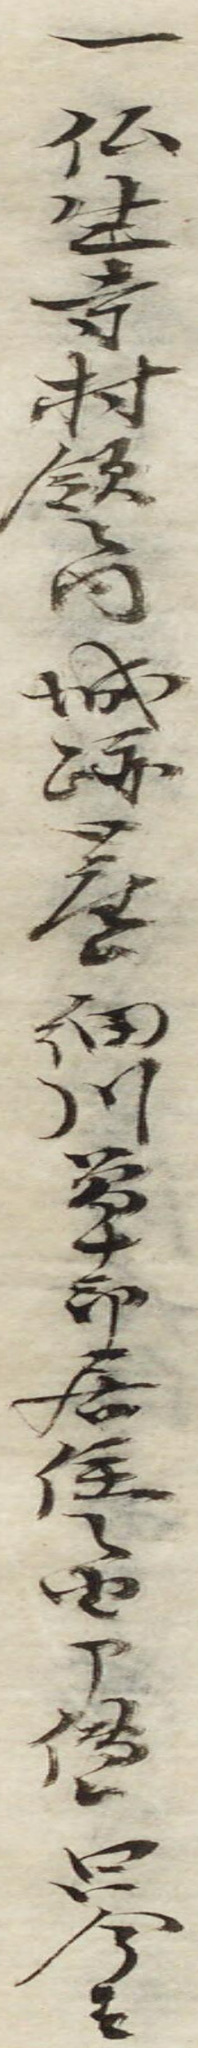一仏生寺村領之内城跡御座候細川曽十郎居住之由申伝候只今は
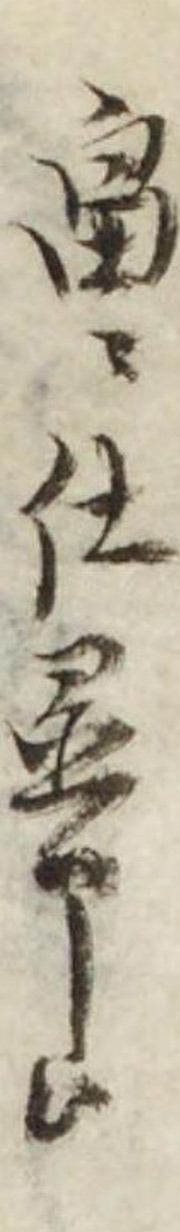畠に仕置申候
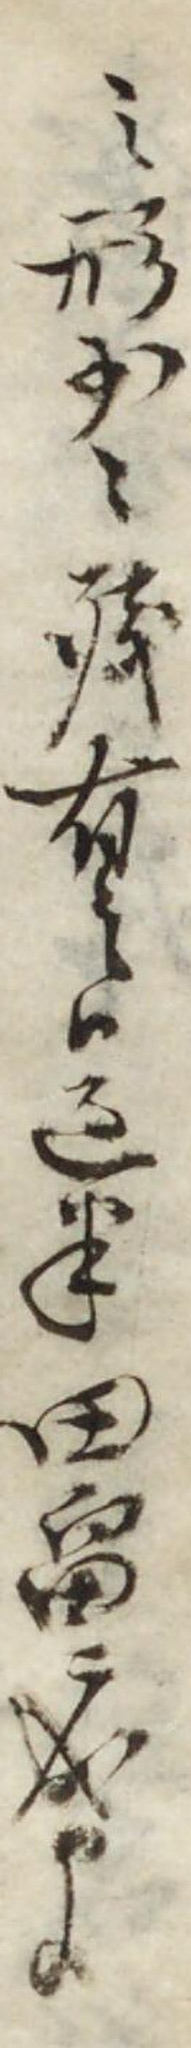之形少々残有之候過半田畠に成申候
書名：加越能旧聞録
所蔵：Ishikawa Prefectural Library
